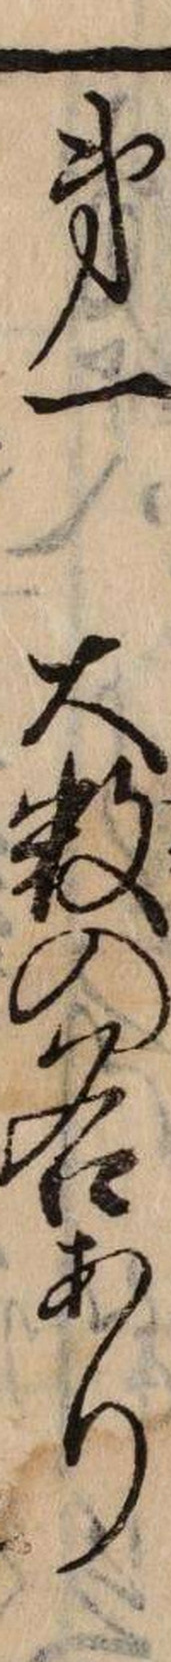第一大数の名あり
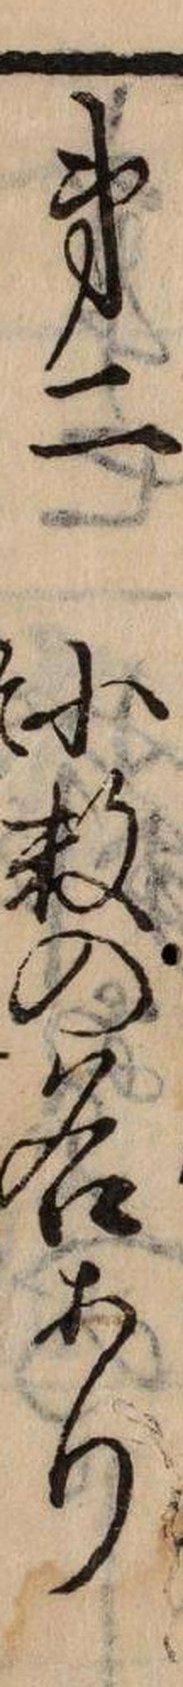第二小数の名あり
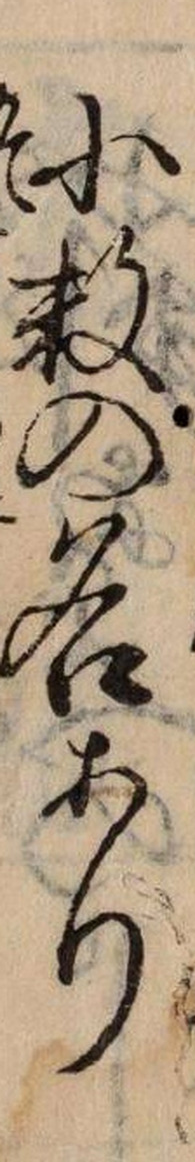第一大数の名あり
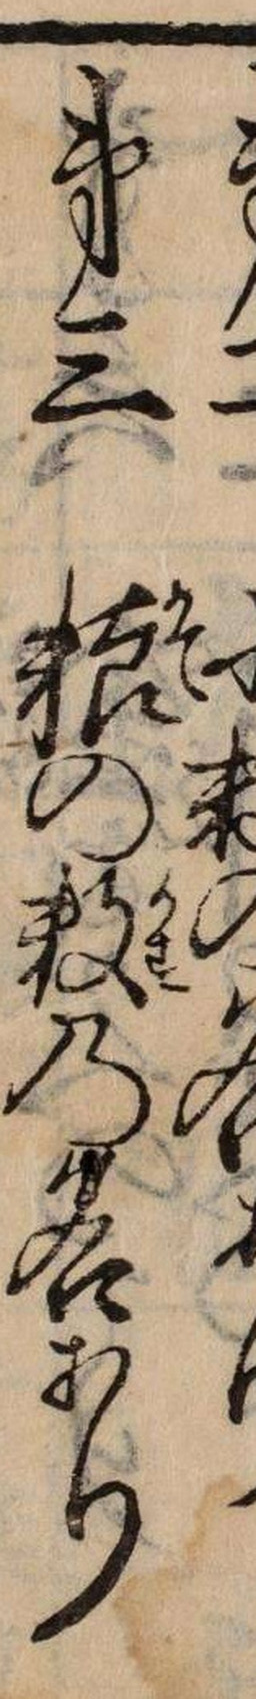第三粮の数の名あり
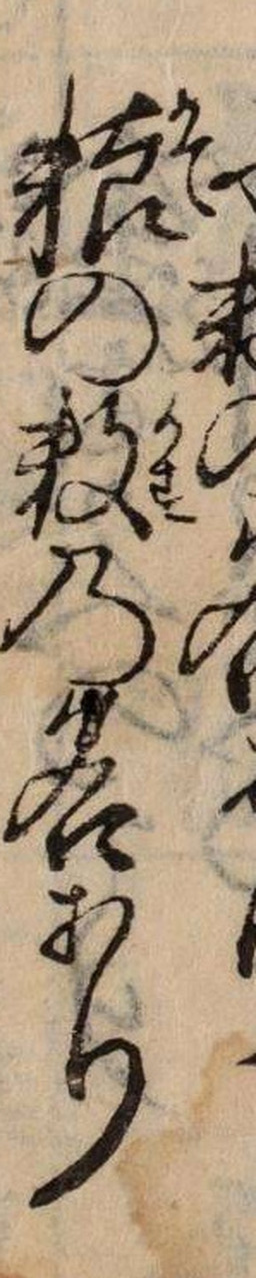第三粮の数の名あり
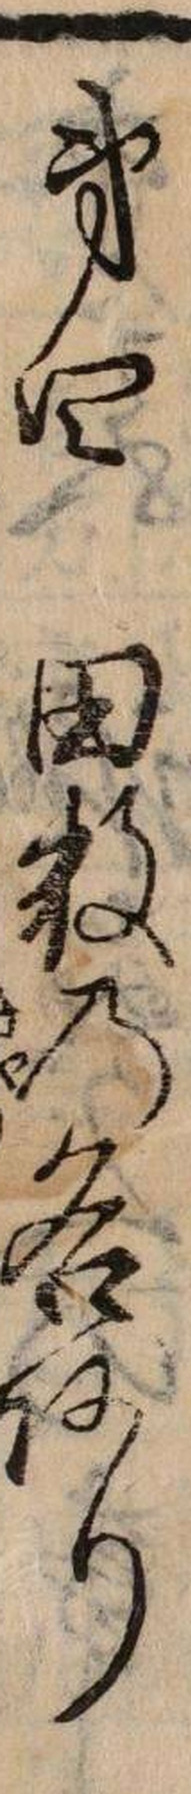第四田数の名あり
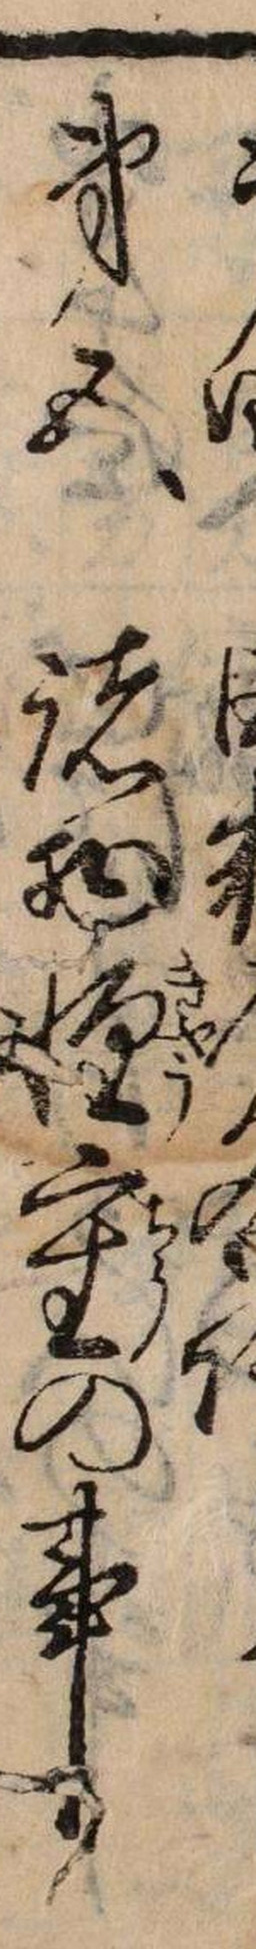第五諸物軽重の事
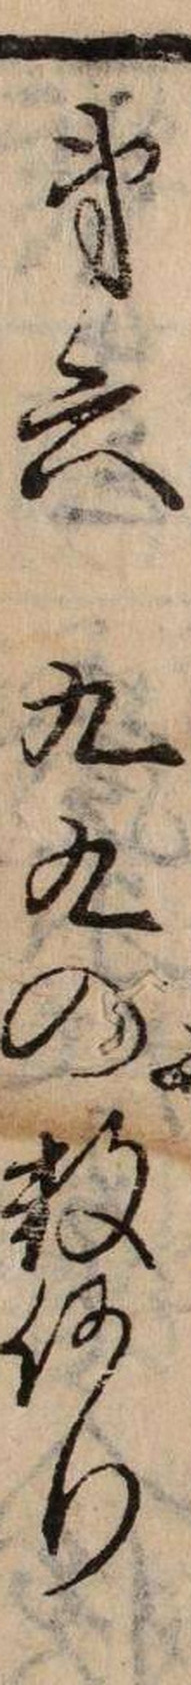第六九九の数あり
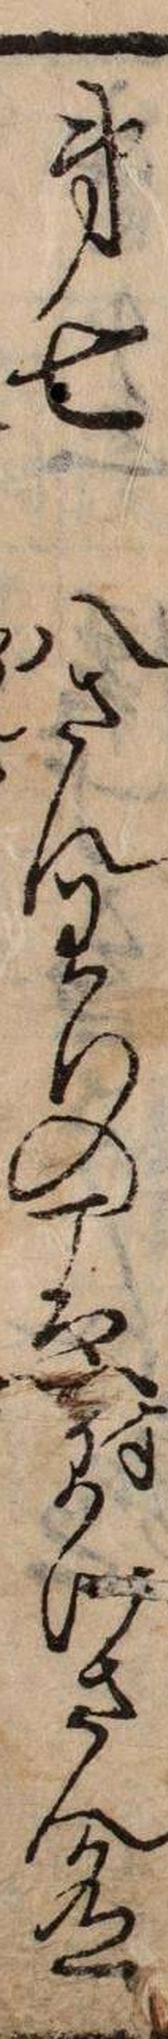第七八さんわりのこゑ付かけさん有
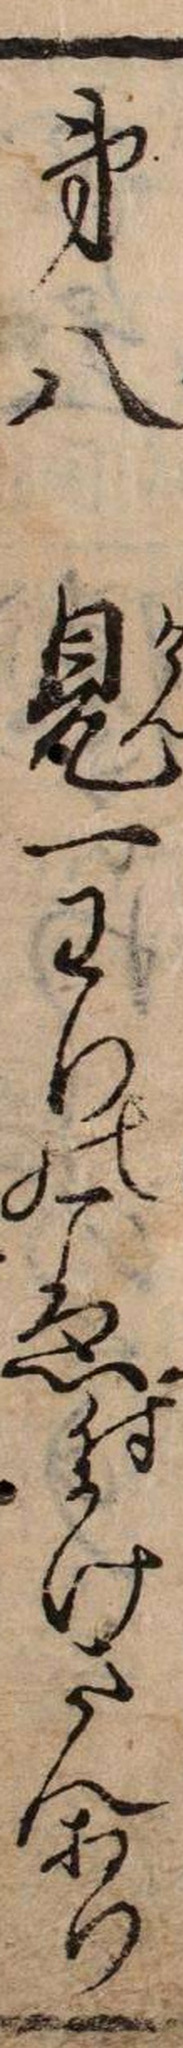第八見一わりのこゑ付かけさんあり
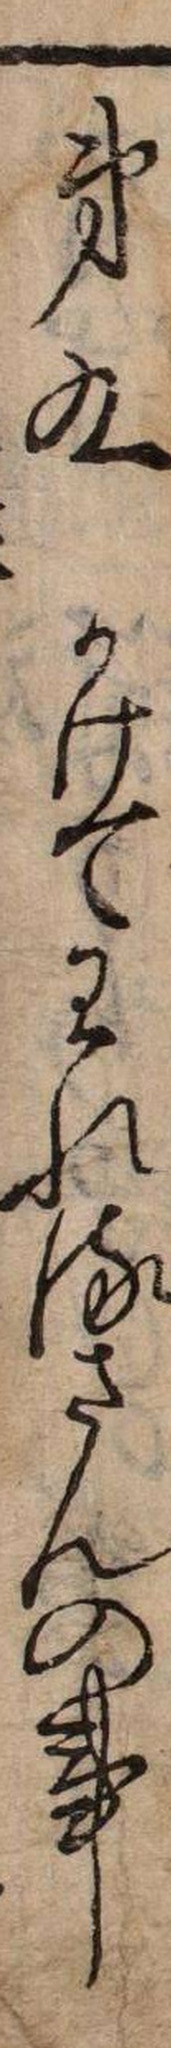第九かけてわれるさんの事

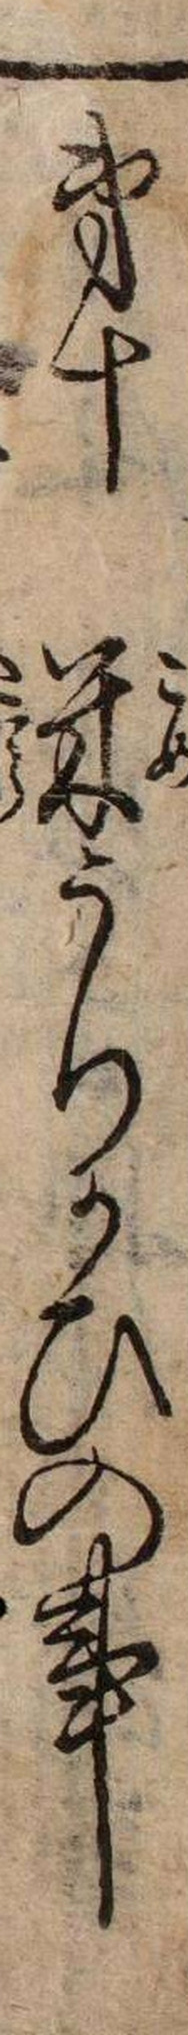第十米うりかひの事
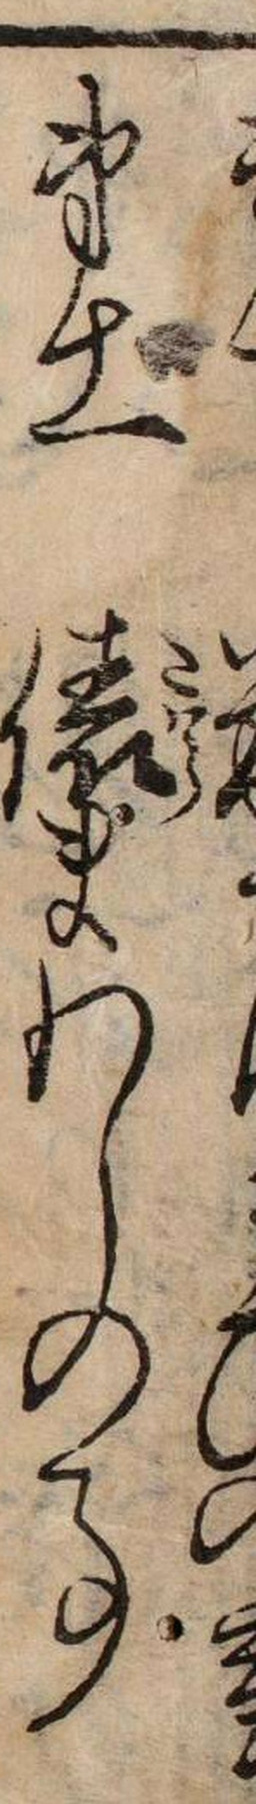第十一俵まわしの事
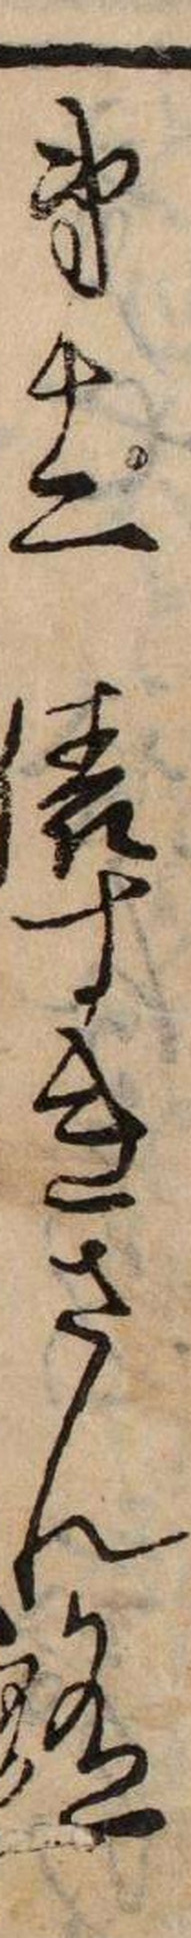第十二俵すきさん有
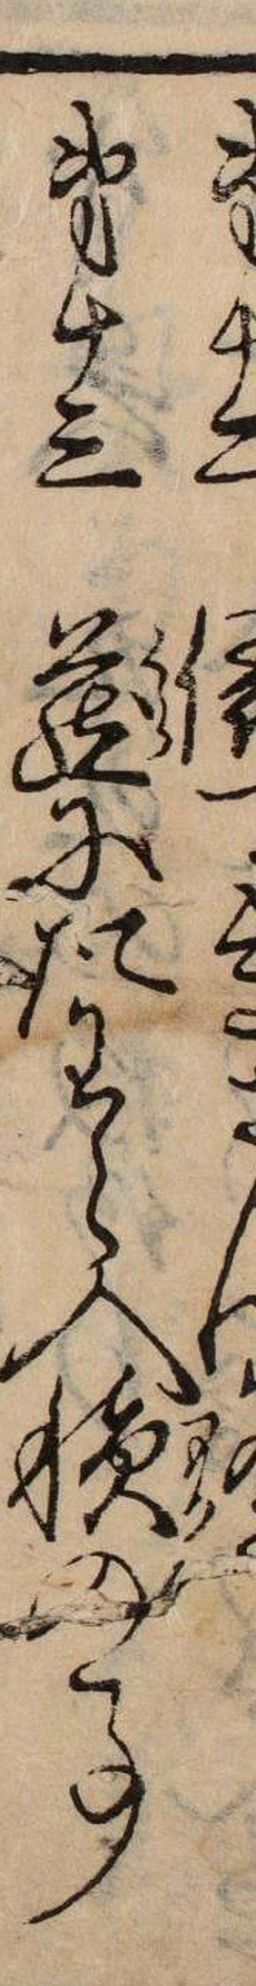第十三蔵にたわら入積の事
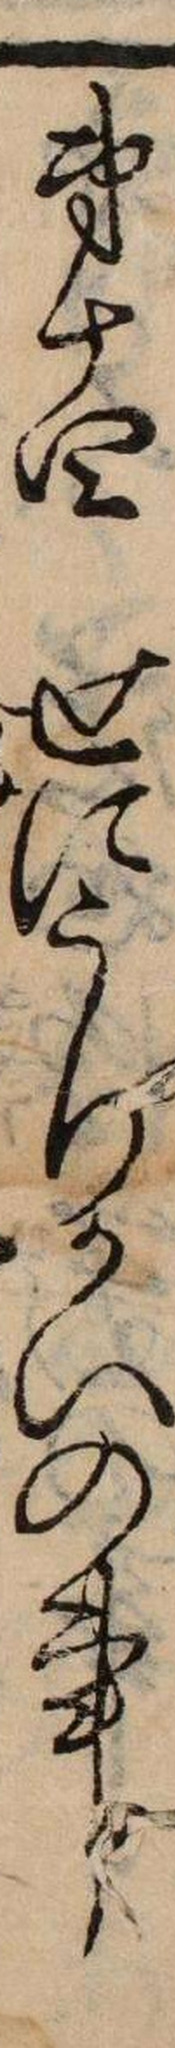第十四せにうちかいの事
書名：塵劫記（寛永11年自跋、京都府立京都学・歴彩館追貴8）
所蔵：京都府立京都学・歴彩館 国文学研究資料館
